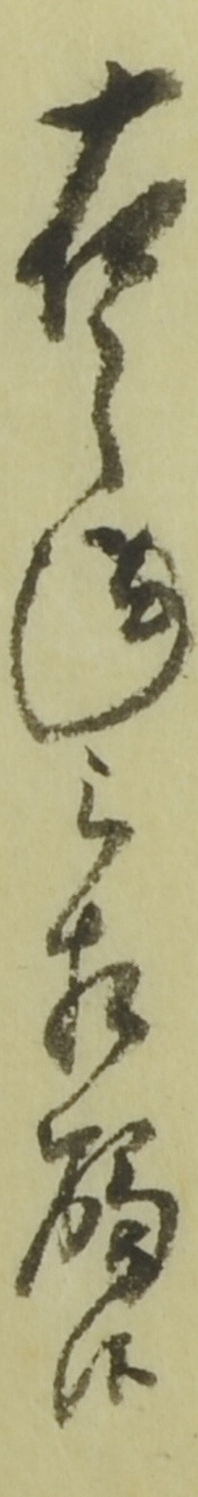右之趣被相触候
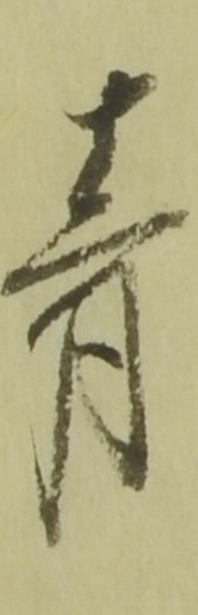十二月
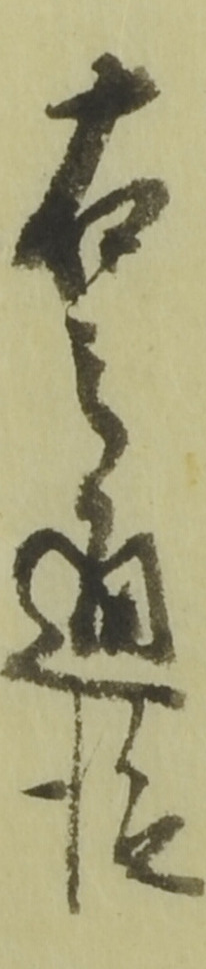右之通従
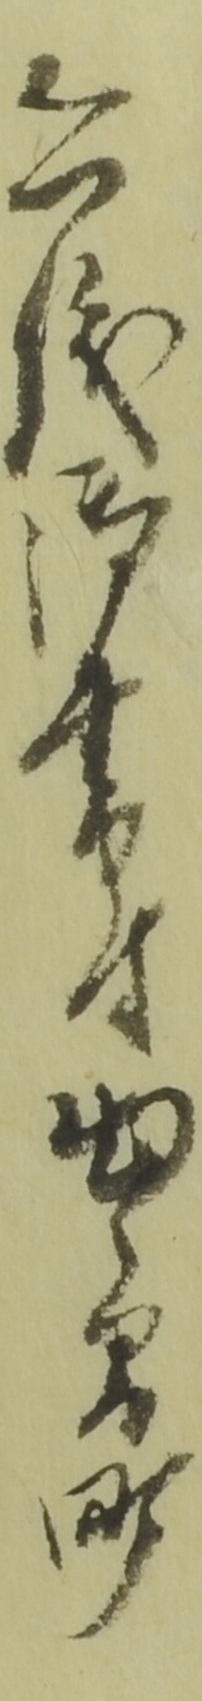公儀御書付出候間町
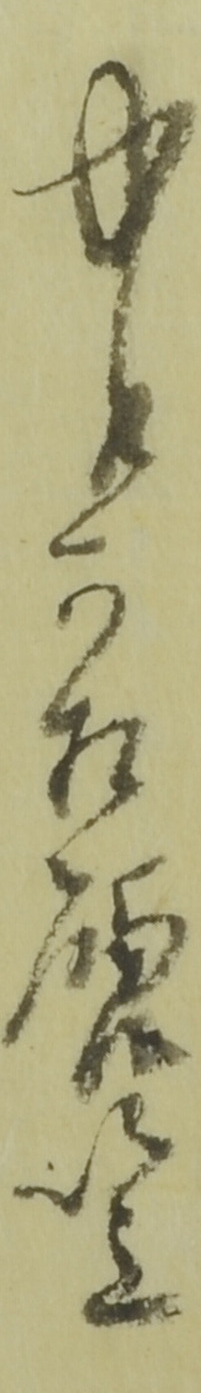中江可相触候以上
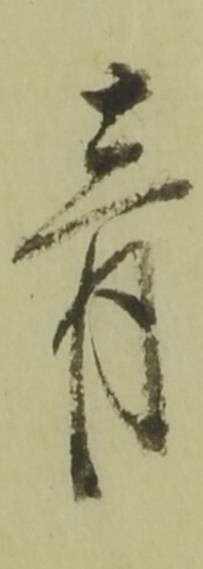十二月
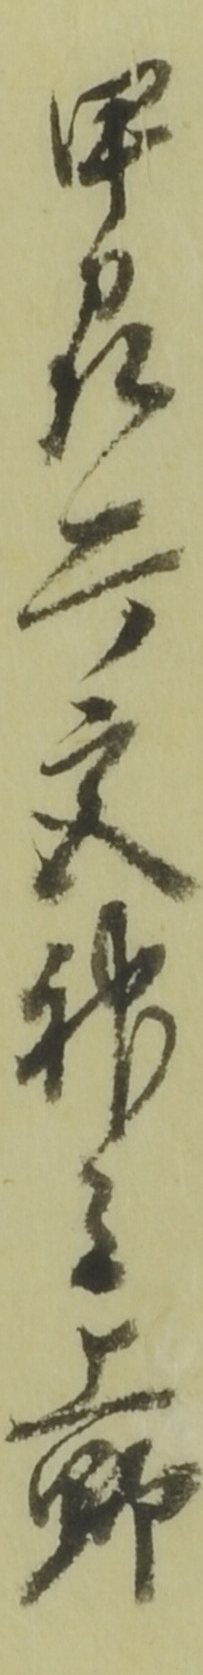甲州二ノ宮神主上野
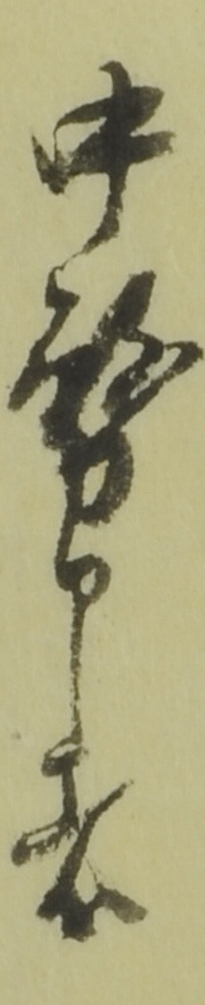中務申者
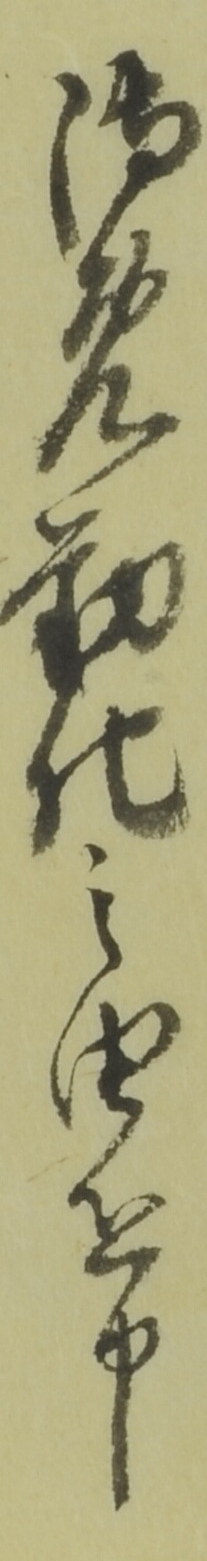御免勧化之由を申
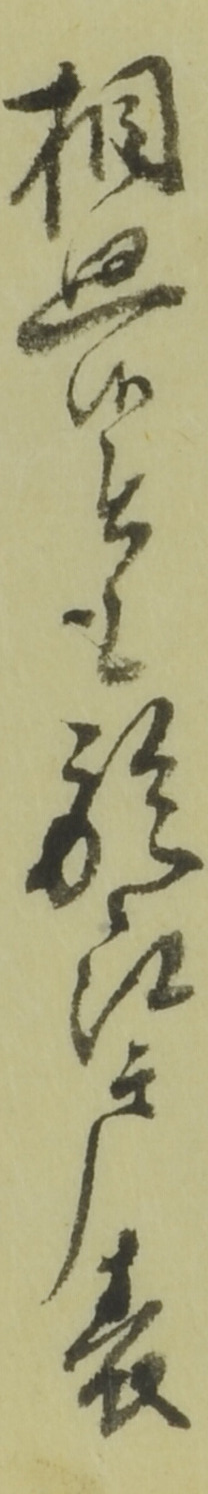相廻候とも於江戸表
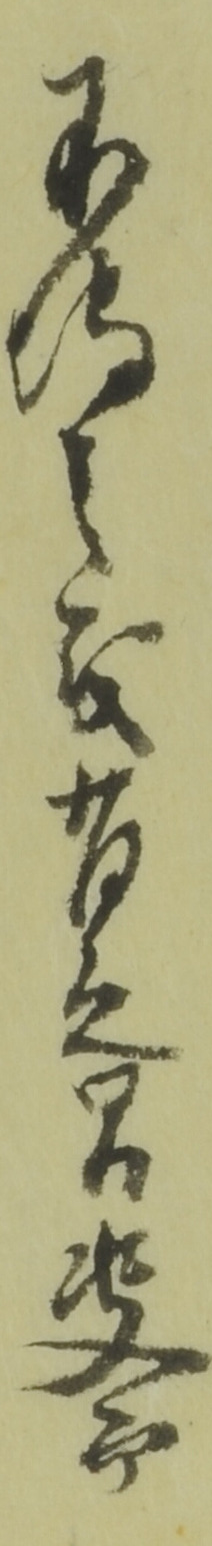不埒之義有之間決而
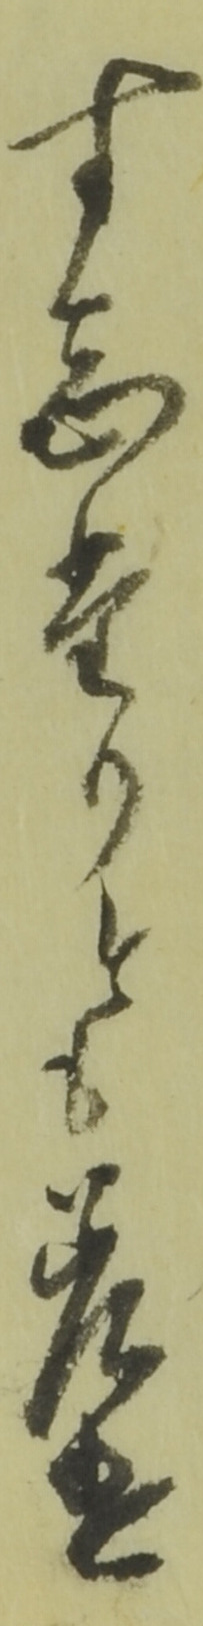すしたりとも差出

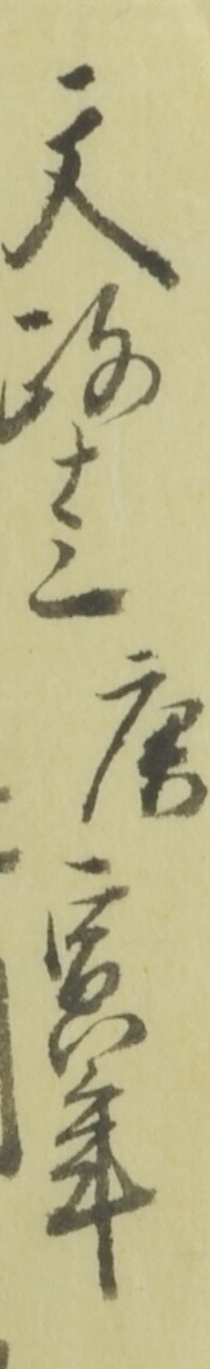文政十三庚寅年
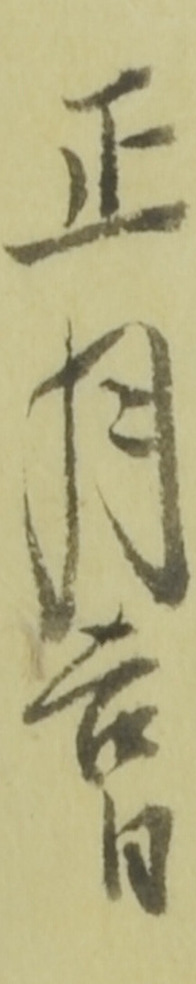正月吉日
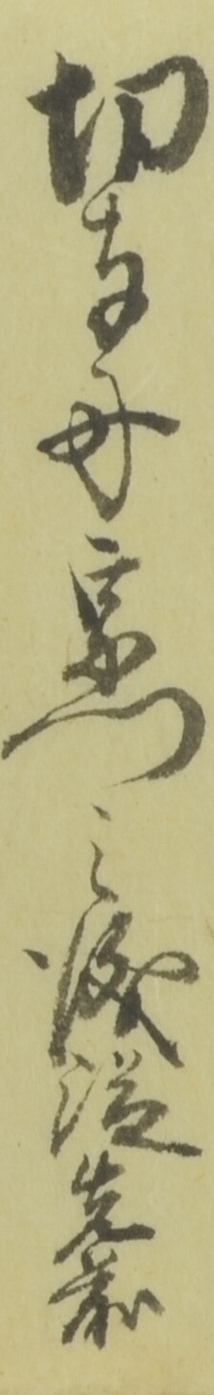切支丹宗門之儀従先前
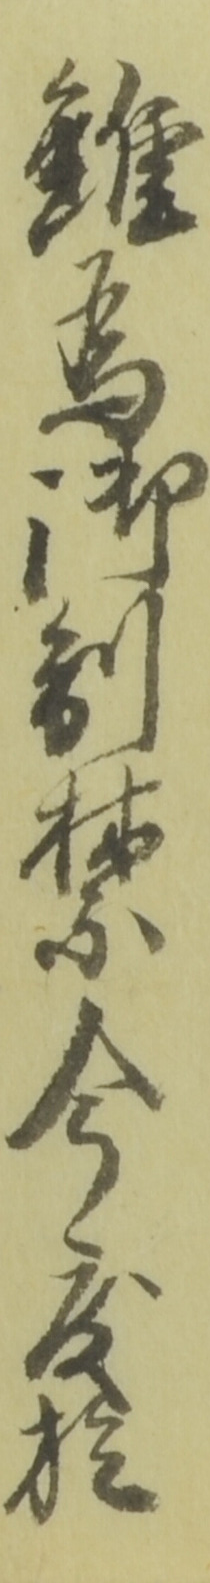雖為御制禁今度於
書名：御触書御書附控
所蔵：伊那市立高遠町図書館・合同会社AMANE
